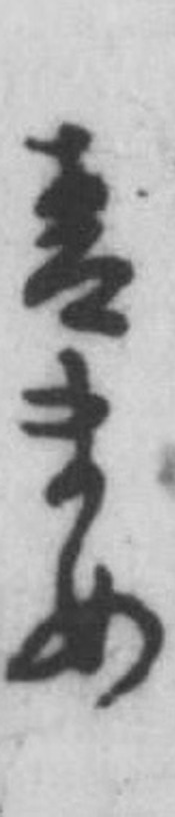青まめ
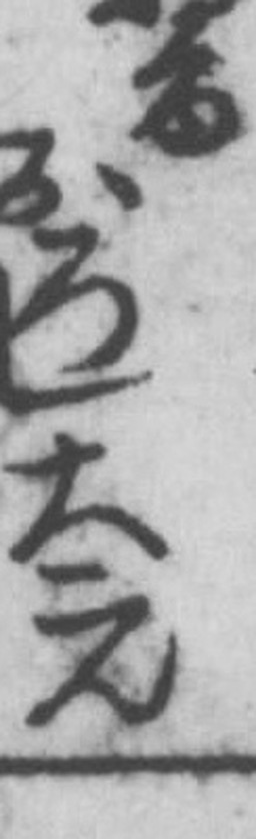おろし大こん
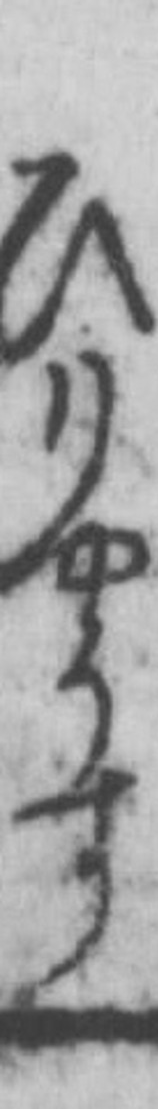ひりやうす

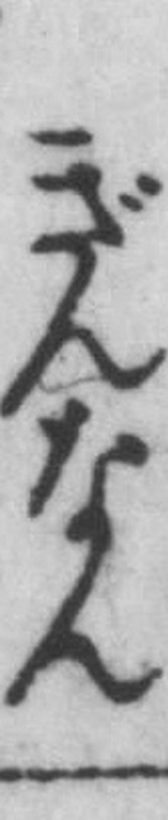ぎんなん
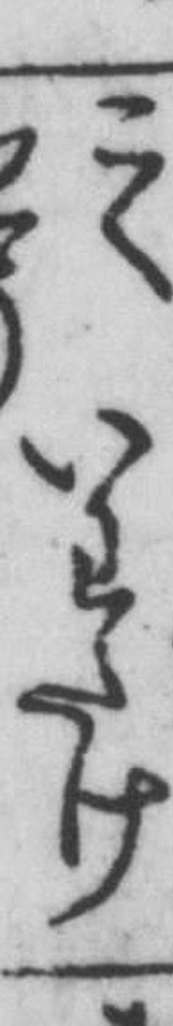せうしいたけ
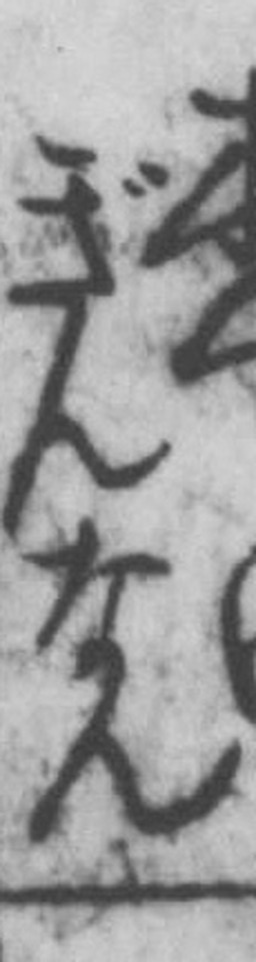ぎんなん
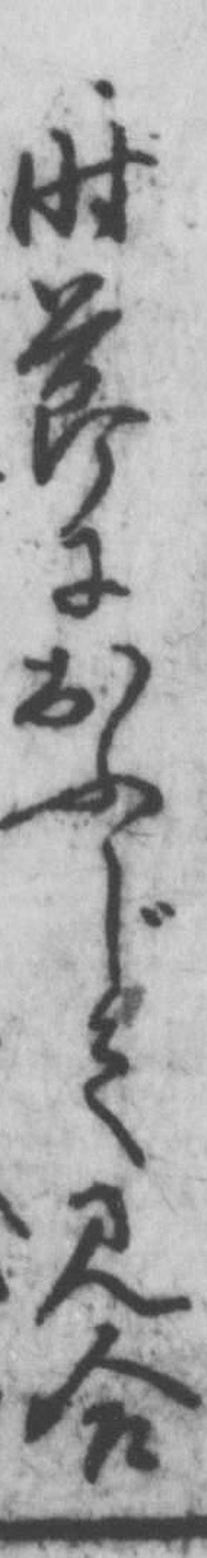時節におふじて見合
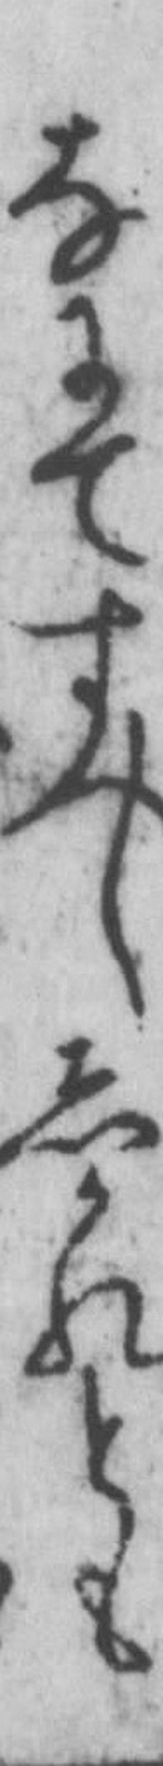なにてすべししかれとも
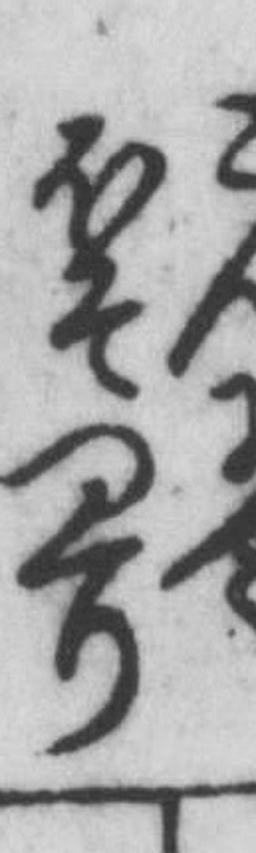ほそつくり
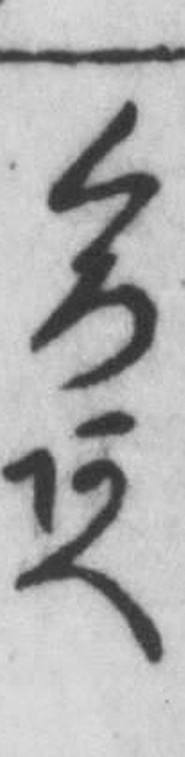くろあへ
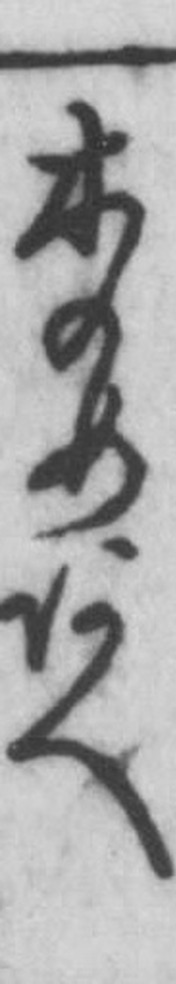木のめあへ
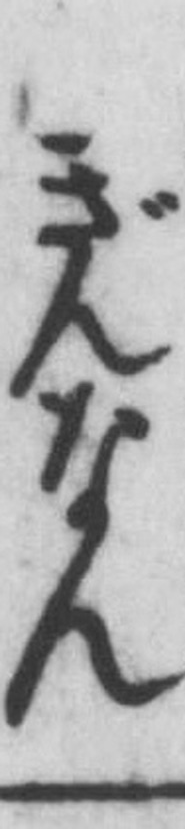ぎんなん
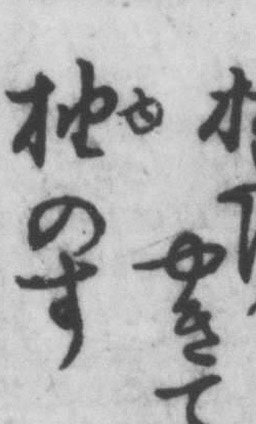柚のす
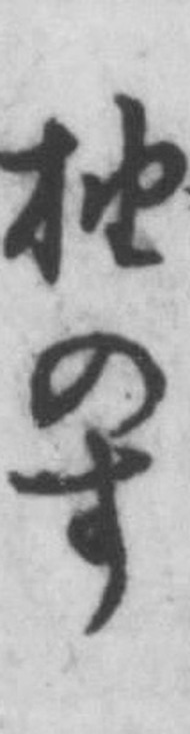柚のす
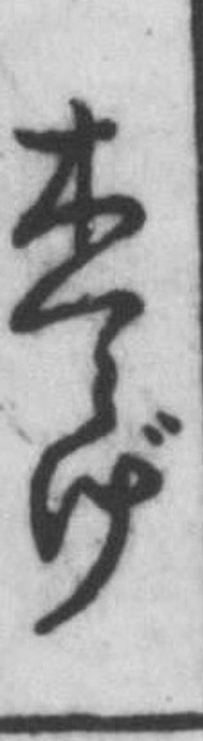木くらげ
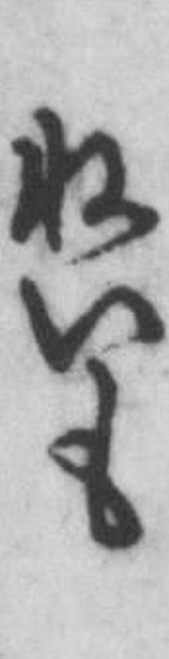ねいも
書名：料理献立抄
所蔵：大阪府立大学学術情報センター 国文学研究資料館
